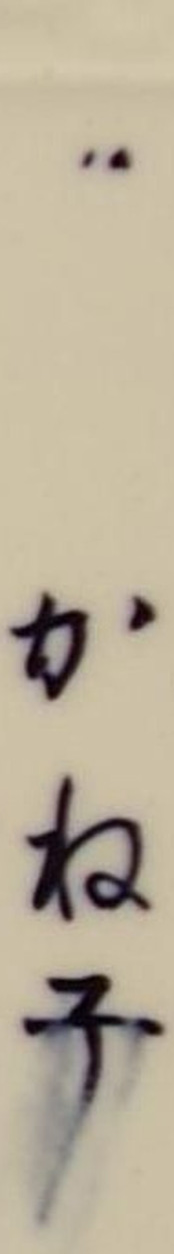かね子
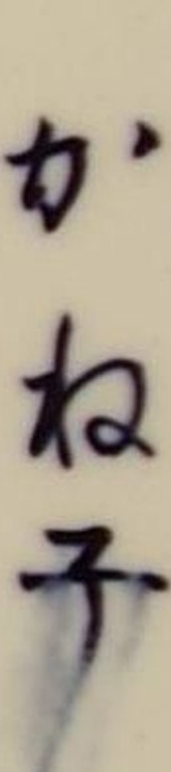かね子
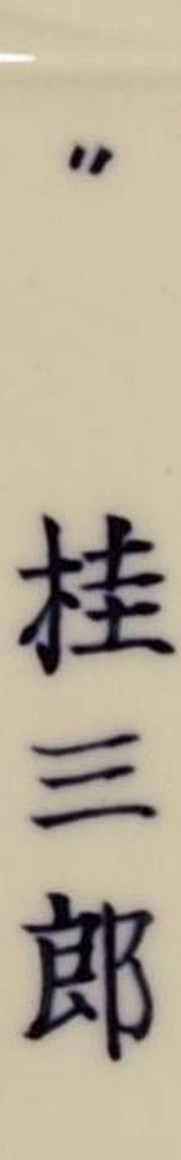桂三郎
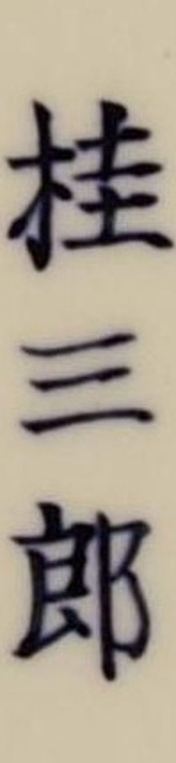桂三郎
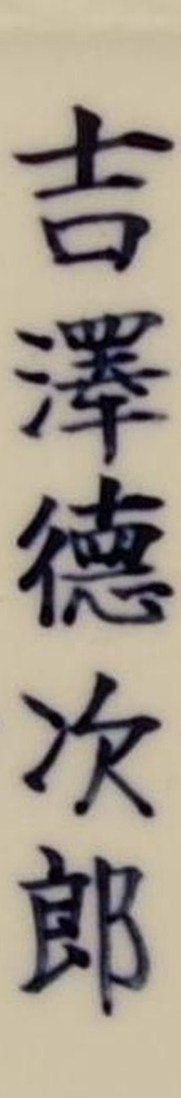吉澤徳次郎
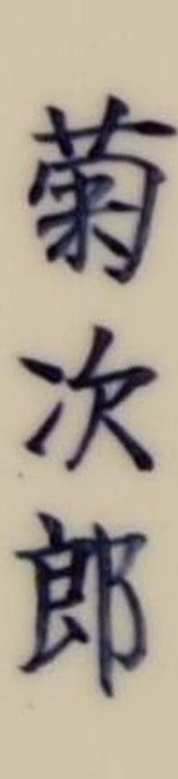菊次郎
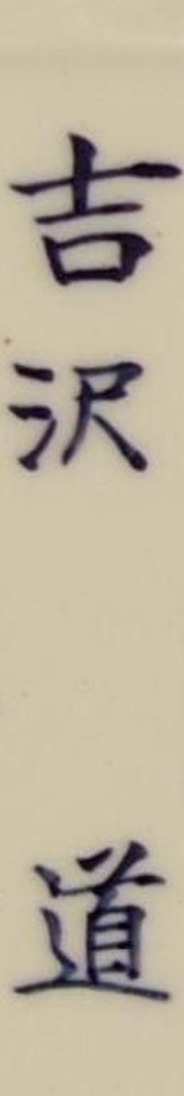吉沢道
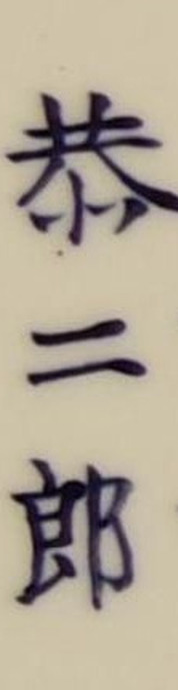恭二郎
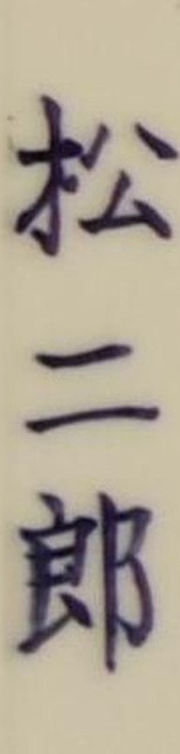松二郎

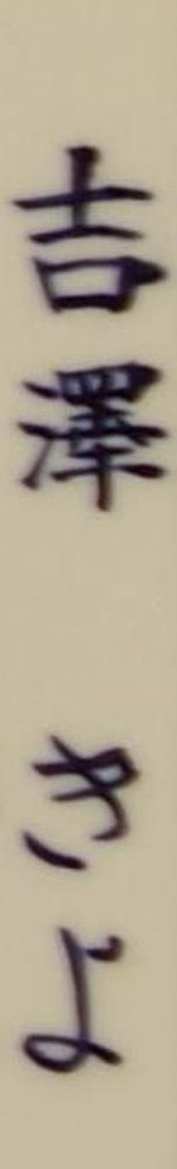吉沢きよ
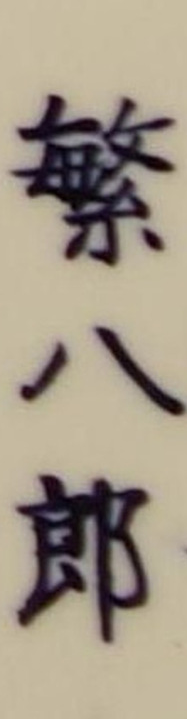繁八郎
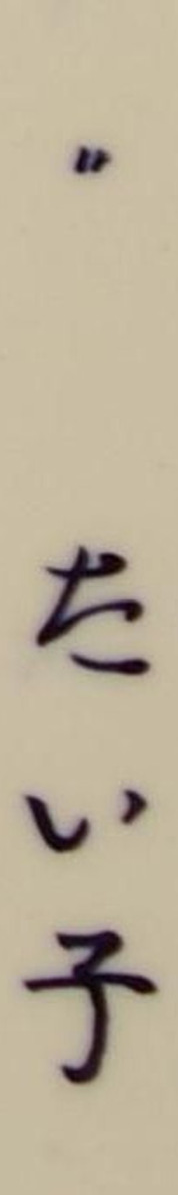たい子
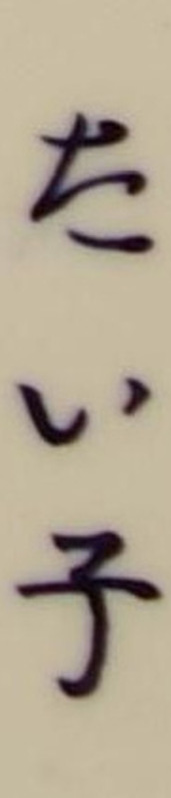たい子
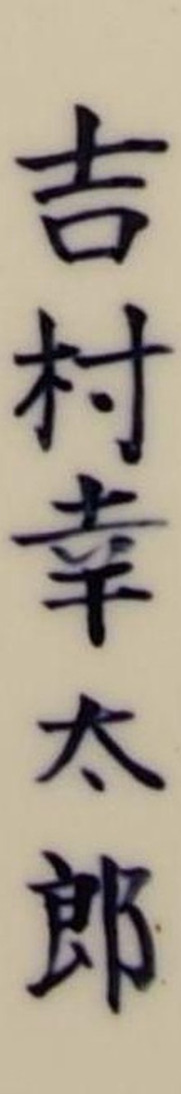吉村幸太郎
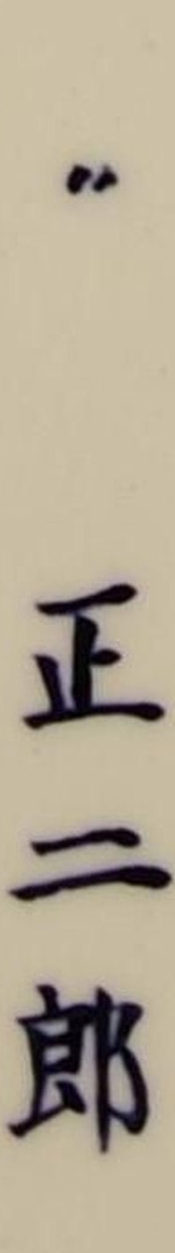正二郎
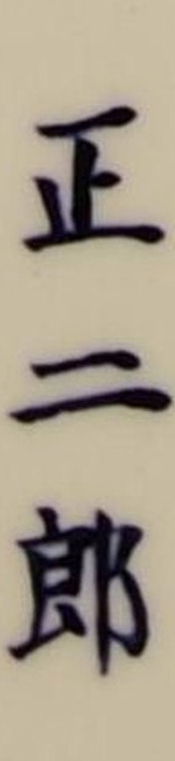正二郎
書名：A~D
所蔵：koyasan kongobuji
